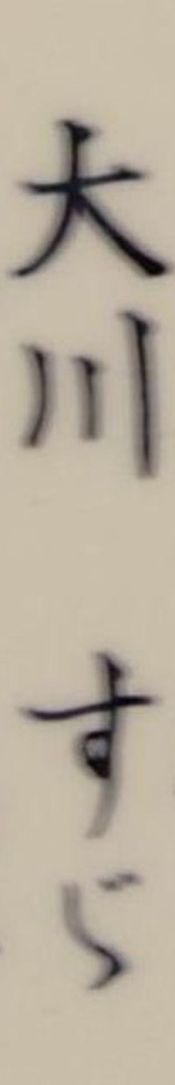大川すゞ
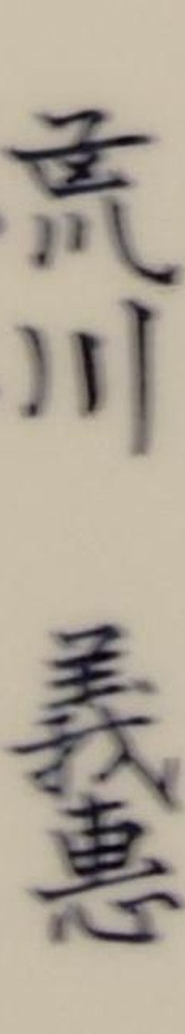荒川義恵
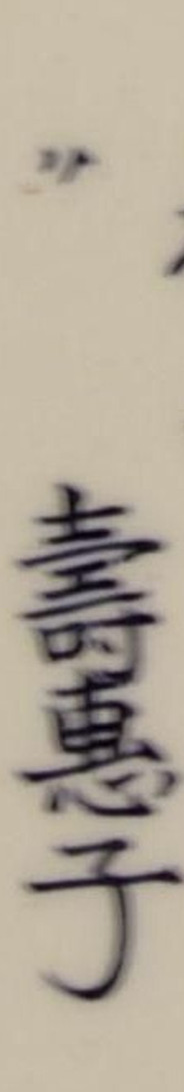寿恵子
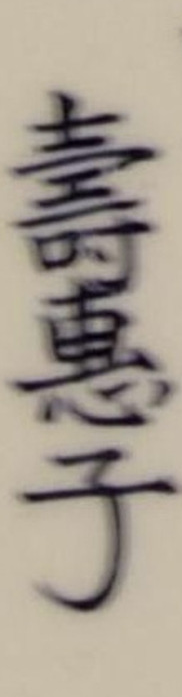寿恵子
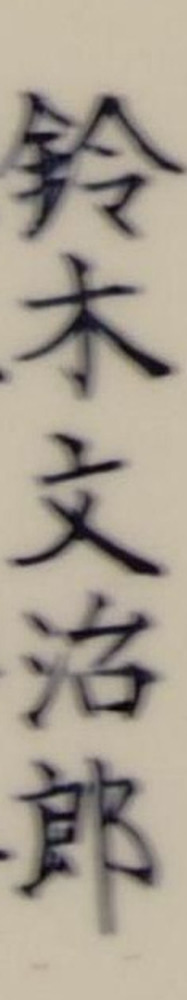鈴木文治郎
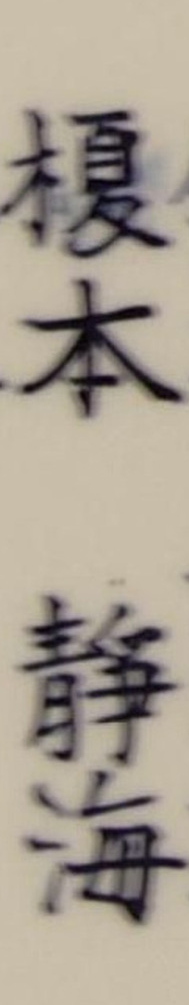榎本静海
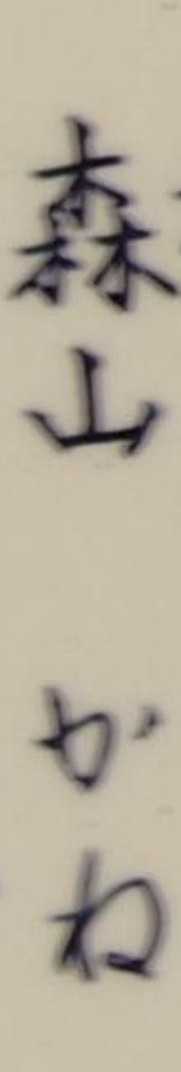森山かね
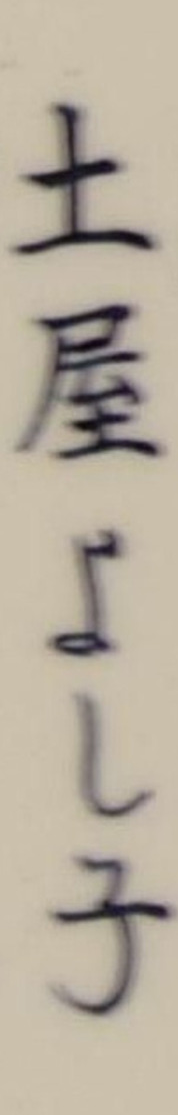土屋よし子
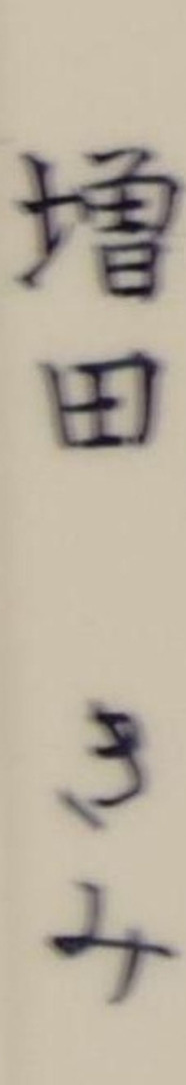増田きみ

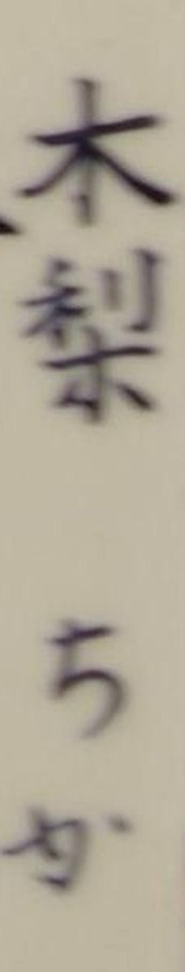木梨ちか
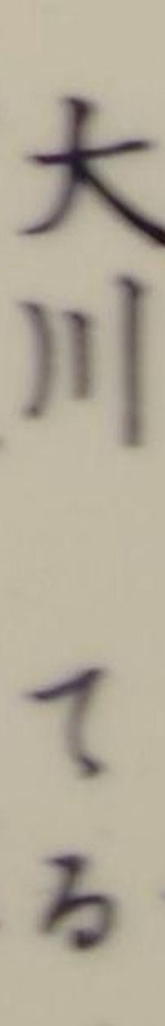大川てる
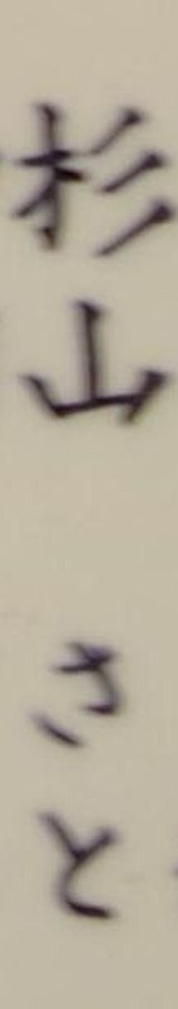杉山さと
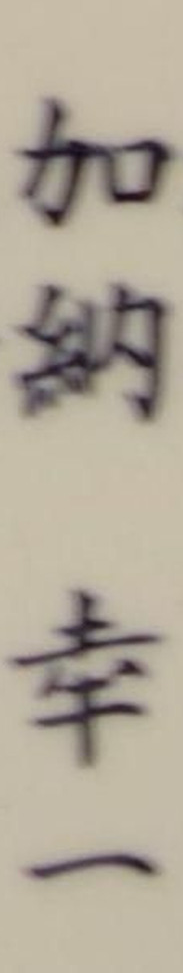加納幸一
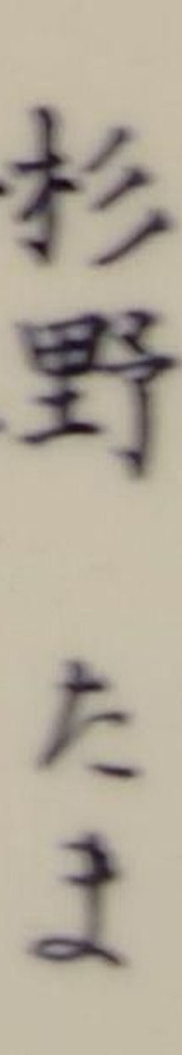杉野たま
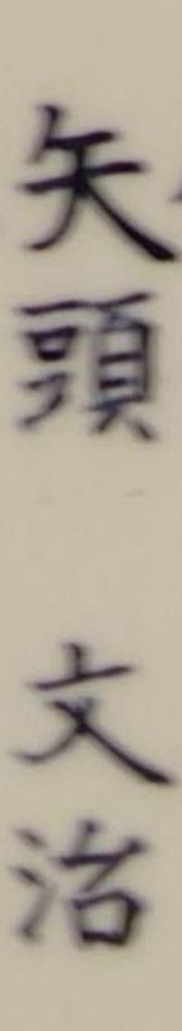矢頭文治
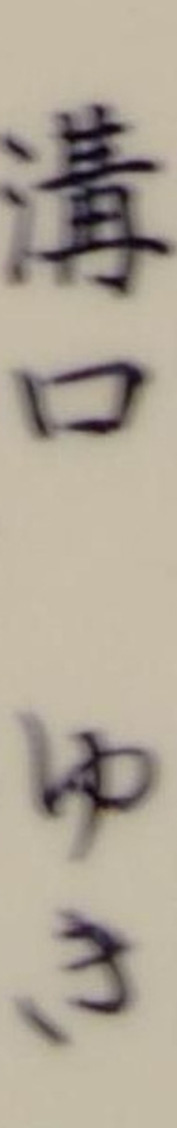溝口ゆき
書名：E~L
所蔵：高野山金剛峯寺
